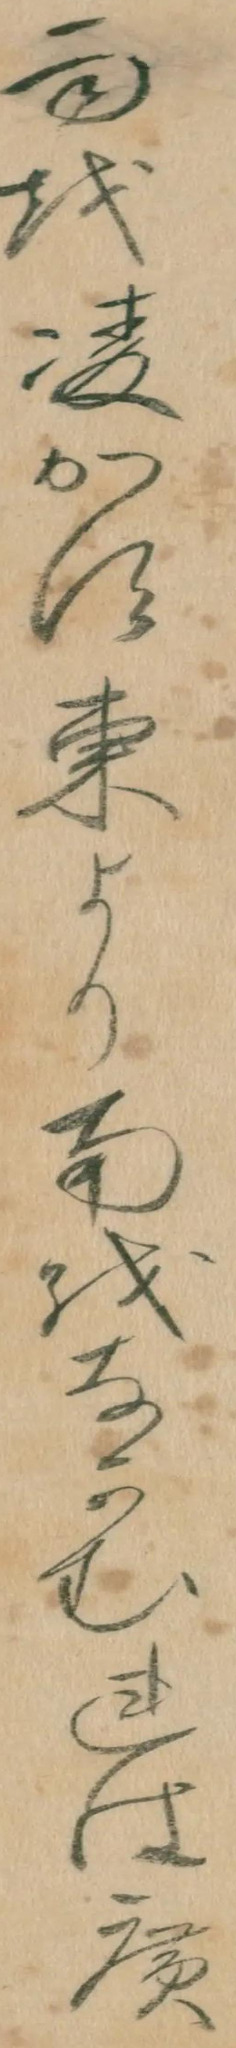雨を凌かす東より南をなかむれは広
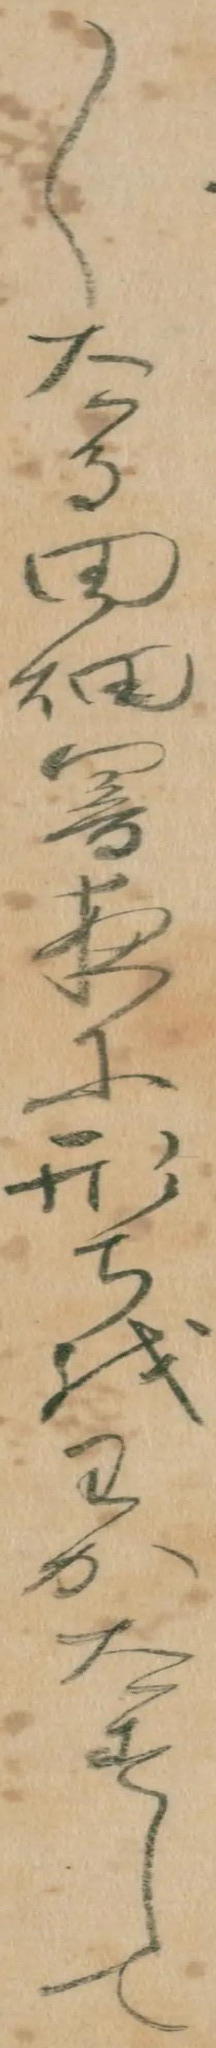〳〵たる田畑闇夜に形ちをわかたすして
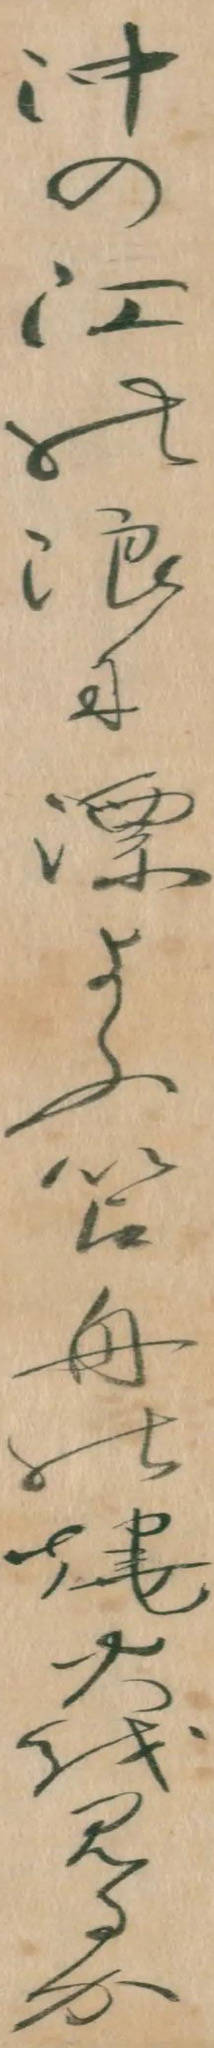沖の江の浪に漂よふ苫舟の焼火を見るか
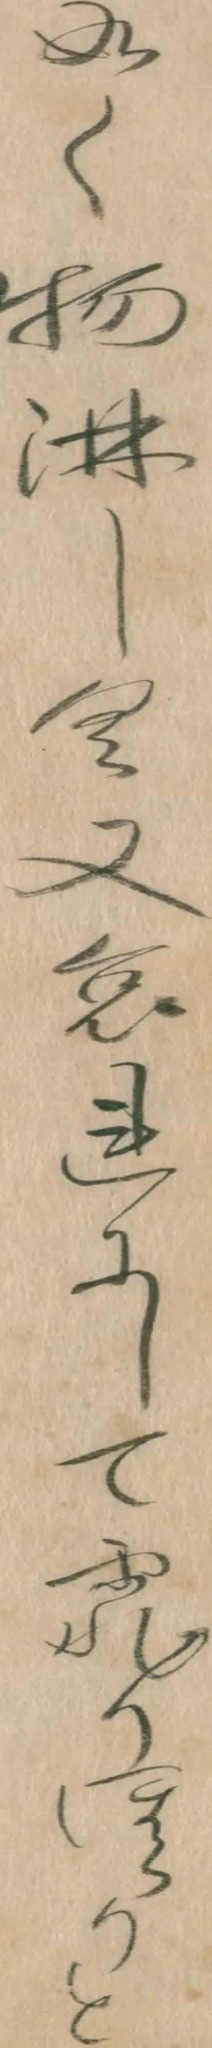如く物淋しく又哀れにして霏りほらりと
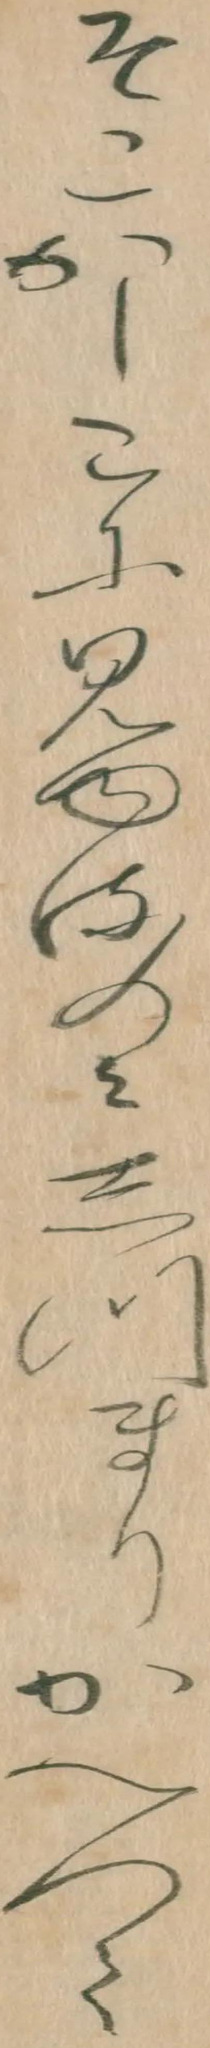そこかしこに見ゆるのみしつまりかへつて
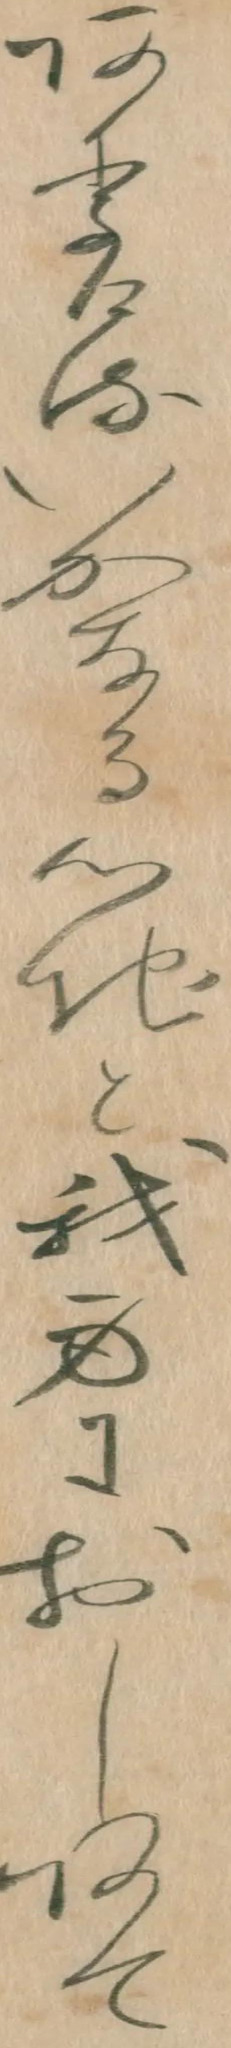ありけるいかなる心地と我身におしあて
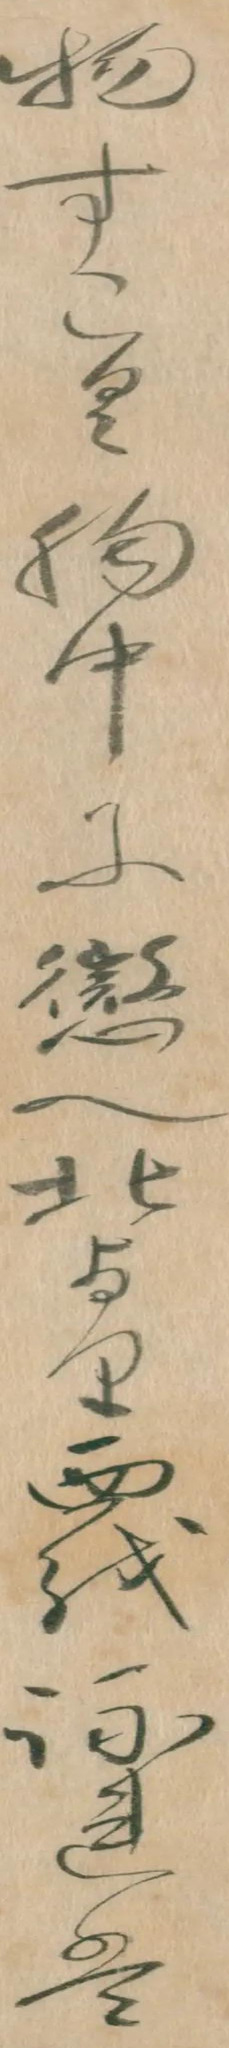物すこく胸中に懲へ北より西を詠れは
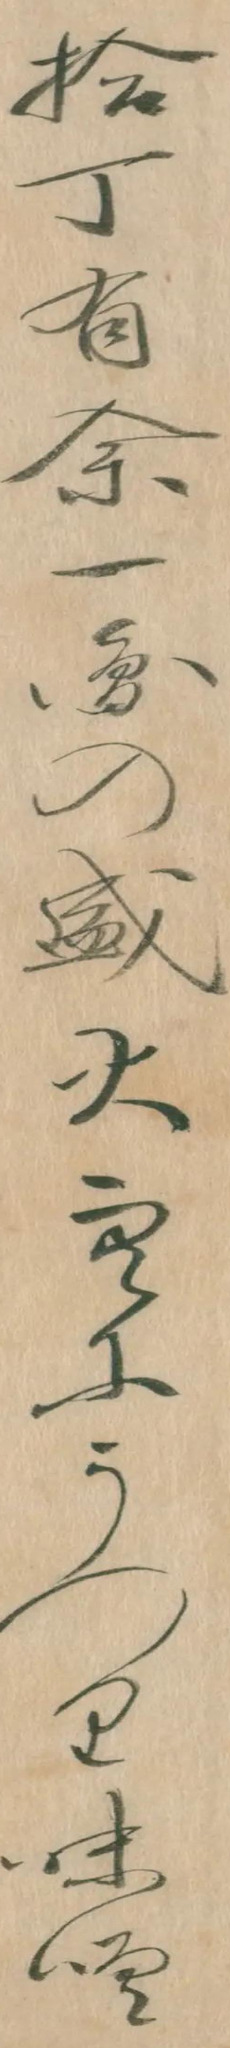拾丁有余一円の盛火空にうつり味噌
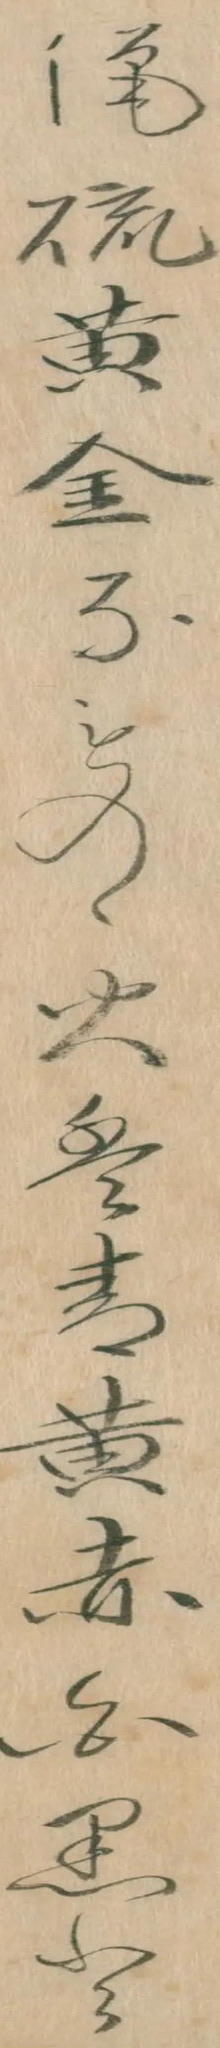硫黄金なものゝ火は青黄赤白黒と
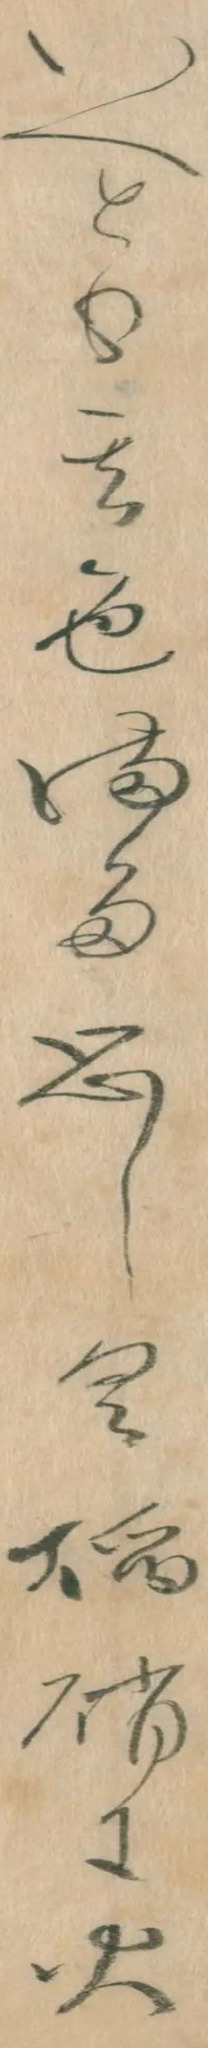いへとも其色また恐しく焔硝に火
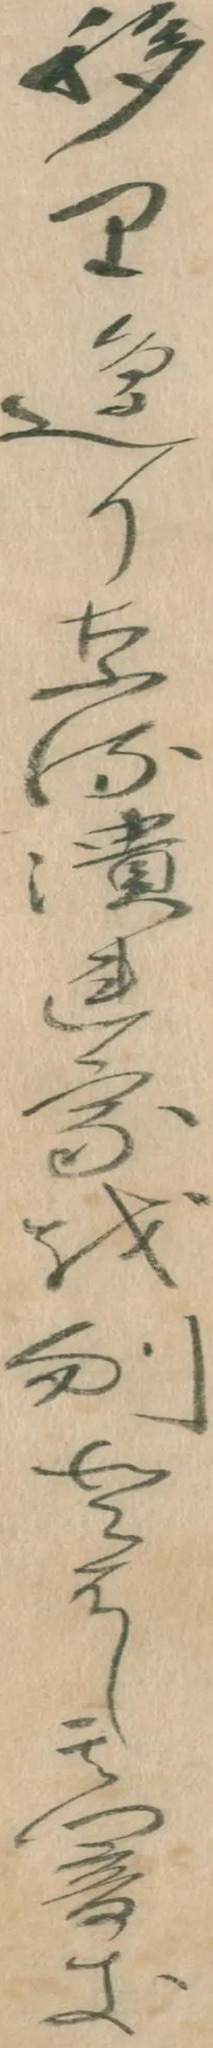移り辺りなる潰れ家を刎とはし其響き
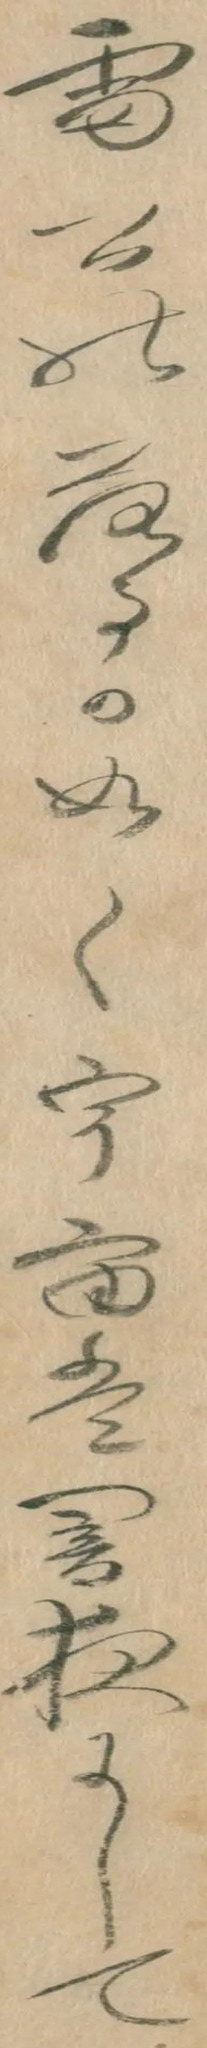雷公の落るか如く宇宙は闇夜にして

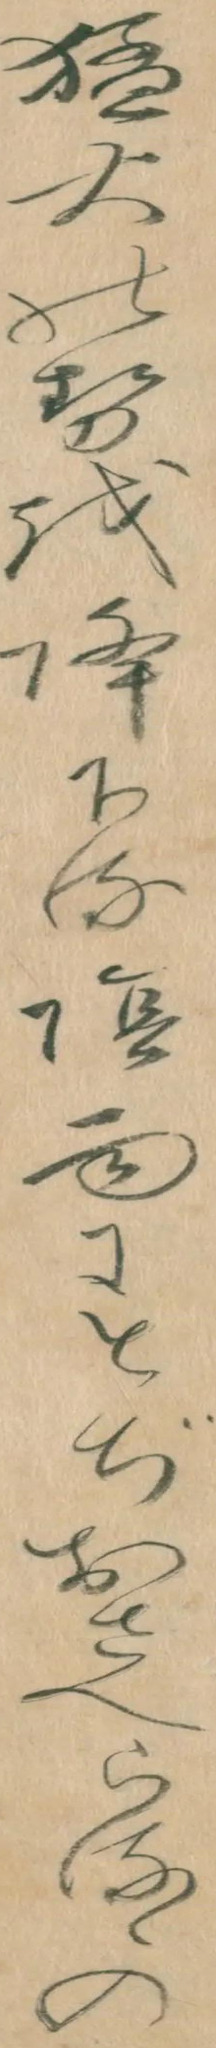猛火の勢を降下る陰雨にとぢおさへらるゝの
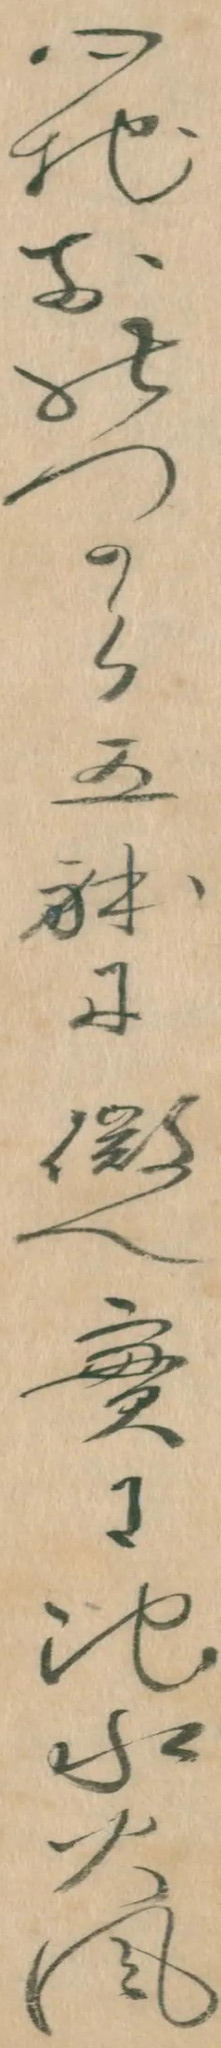心地おのつから五躰に微へ実に地水火風
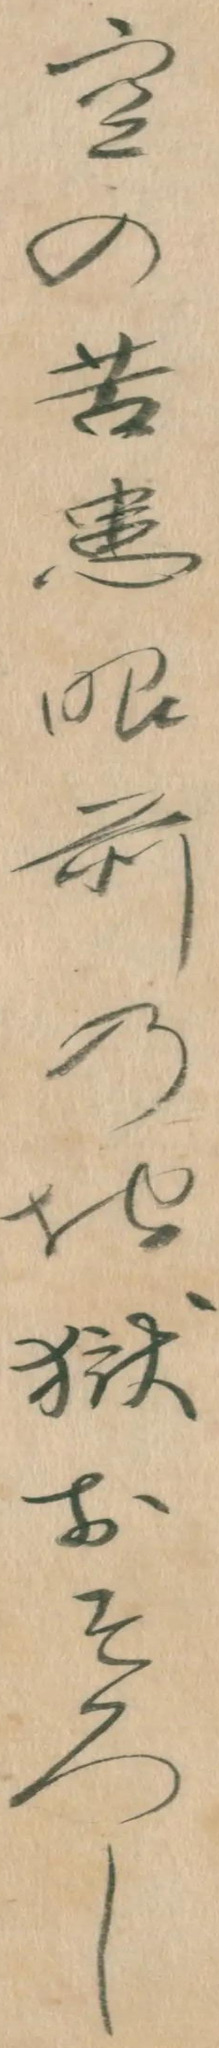空の苦患眼前の地獄おそろし
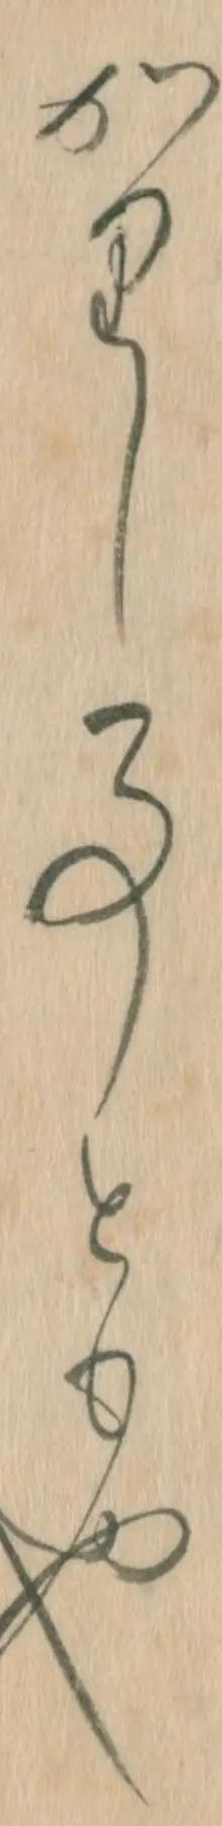かりし事とも也
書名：俗語之種. [4]
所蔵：国立国会図書館 National Diet Library, JAPAN
